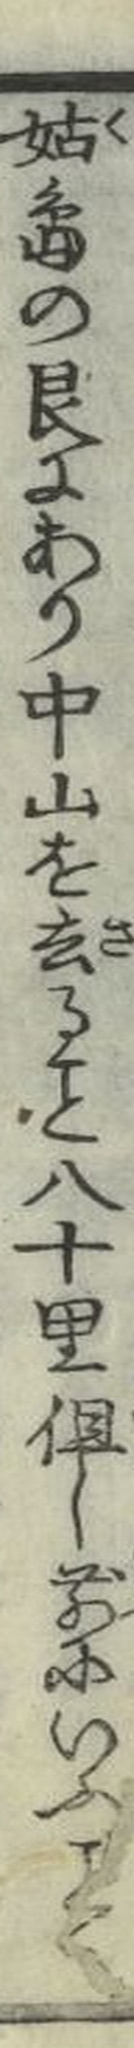姑島の艮にあり中山を去ること八十里但し前にいふごとく
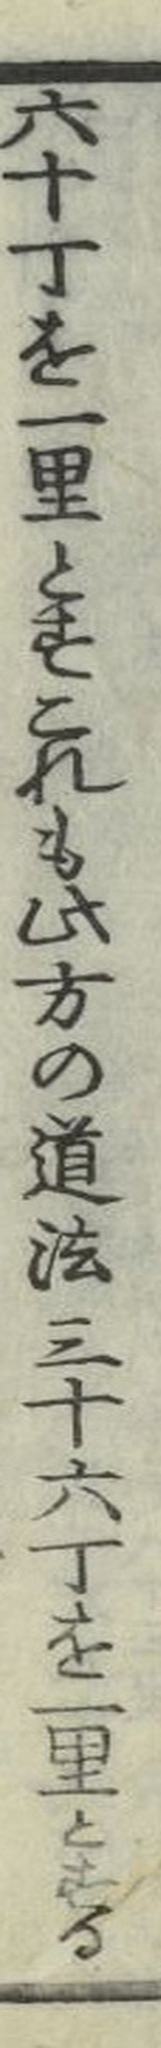六十丁を一里とすこれも此方の道法三十六丁を一里とする
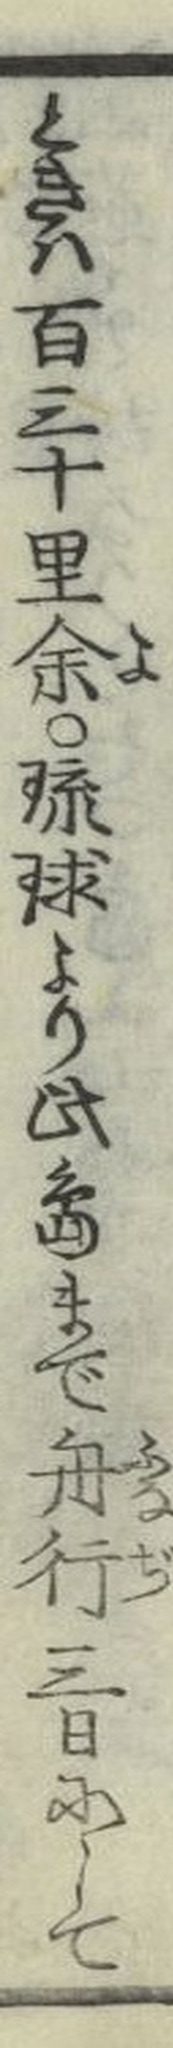ときハ百三十里余〇琉球より此島まで舟行三日にして
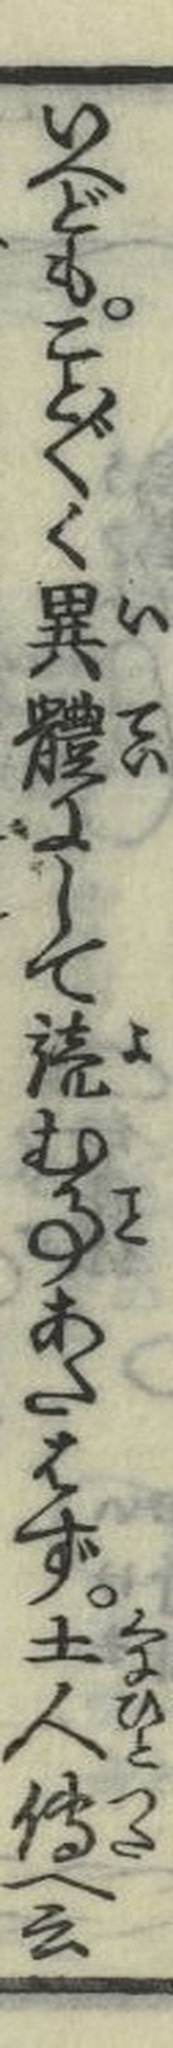いへども。こと〴〵く異體にして読む事あたはず。土人傳へ云
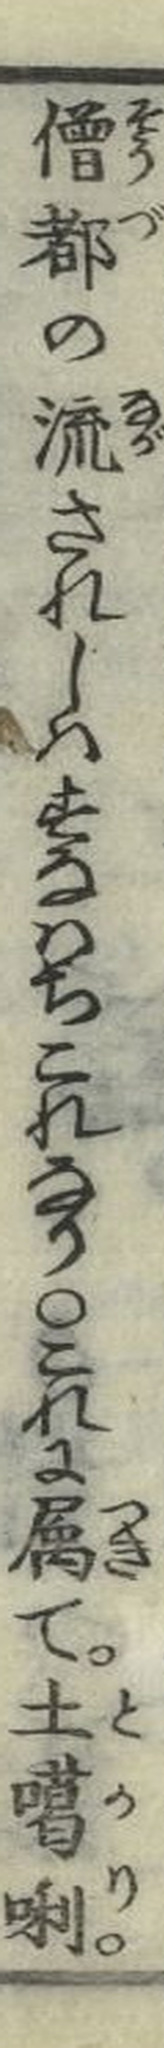僧都の流されしハすなハちこれなり〇これに属て。土噶唎。
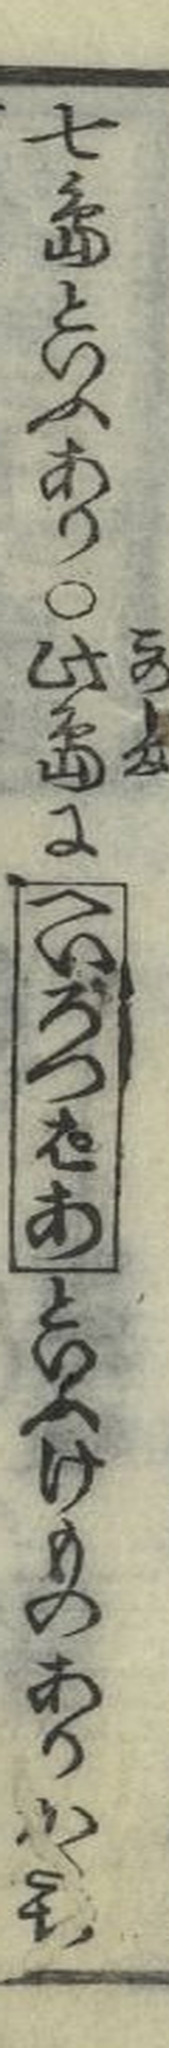七島といふあり〇此島にへいろつばあといふけものありかたち
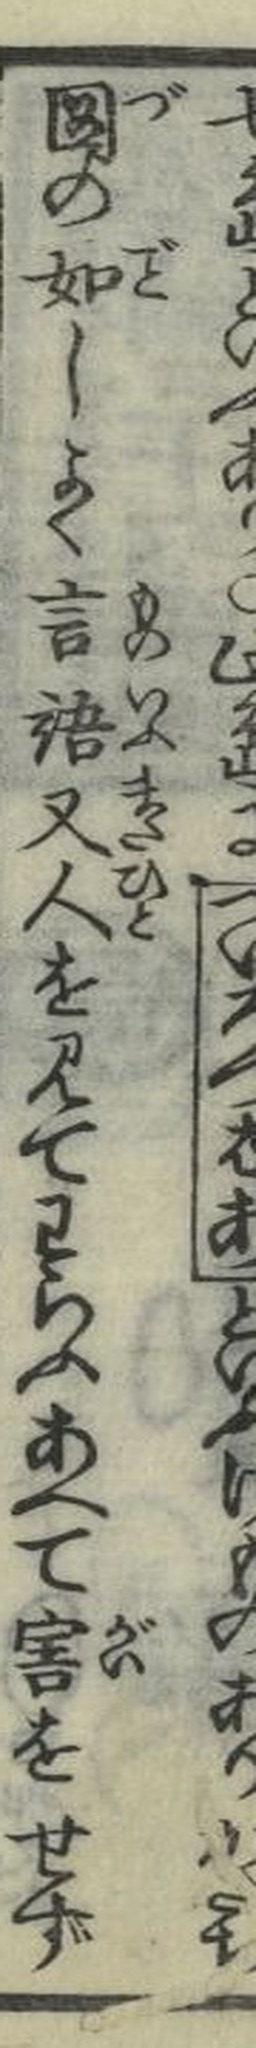圖の如しよく言語又人を見てわらふあへて害をせず

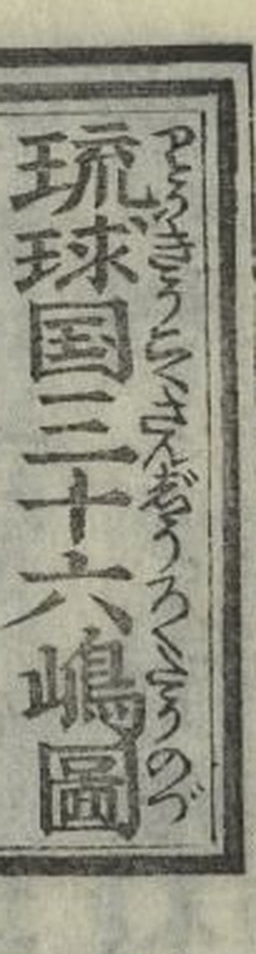琉球国三十六嶋圖

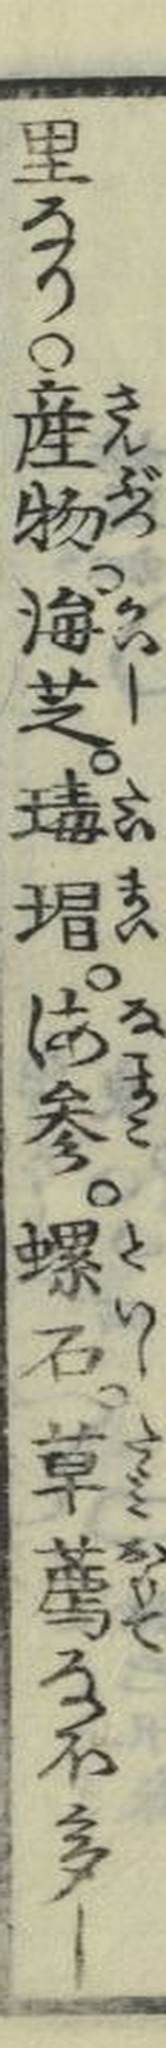里なり〇産物。海芝。瑇琩。海参。螺石。草薦なほ多し
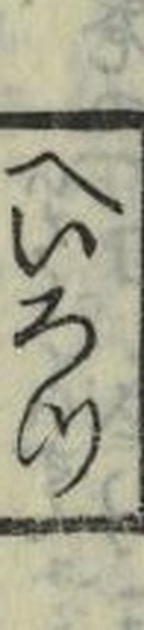へいろつ
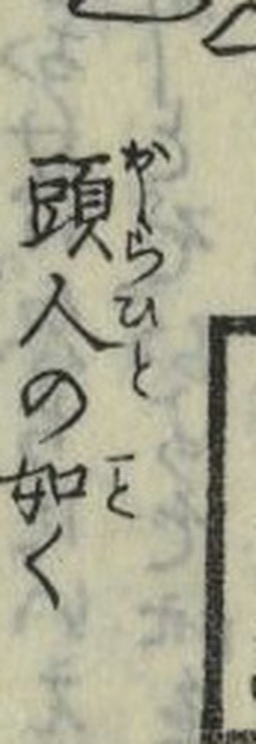頭人の如く
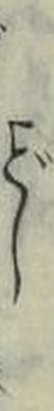ごとし
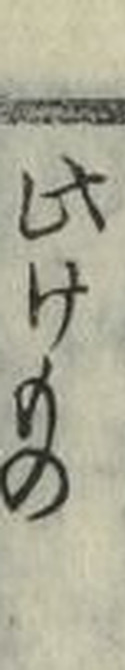此けもの
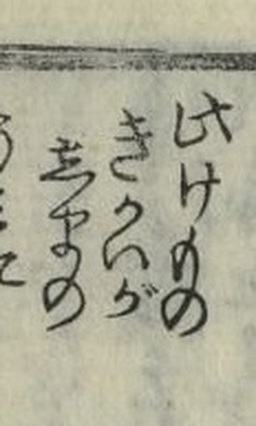きかいが
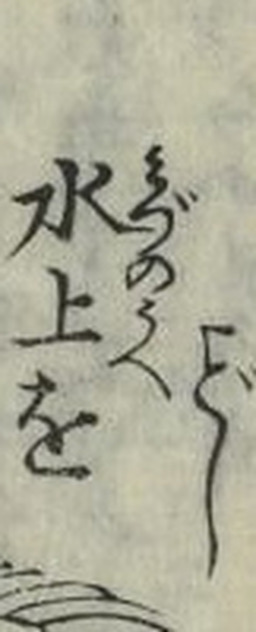水上を
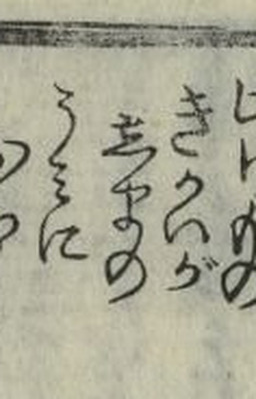しまの
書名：琉球奇譚
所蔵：University of the Ryukyus Library
